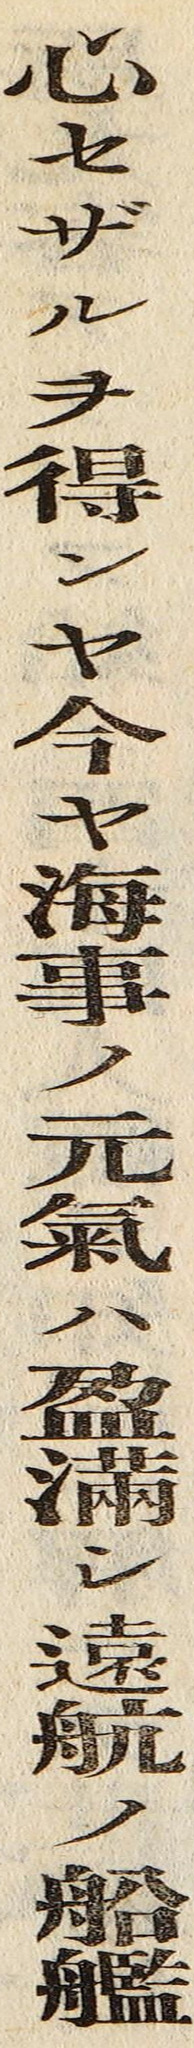心セザルヲ得ンヤ今ヤ海事ノ元気ハ盈満シ遠航ノ船艦
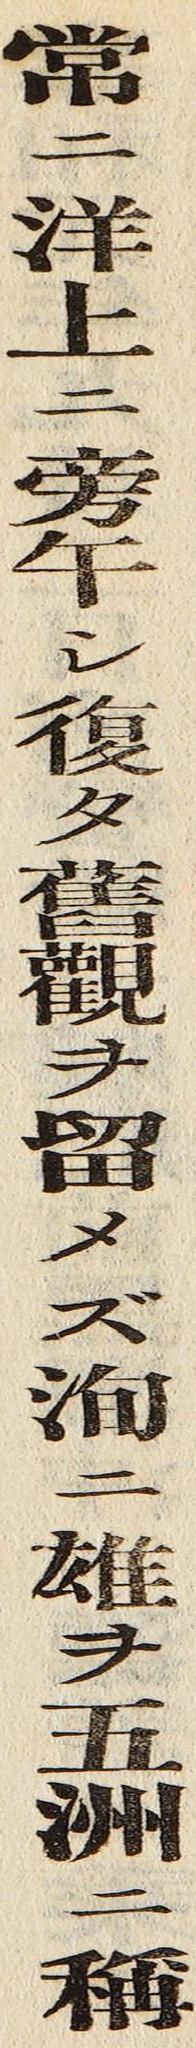常ニ洋上ニ旁午シ復タ旧観ヲ留メズ洵ニ雄ヲ五洲ニ称
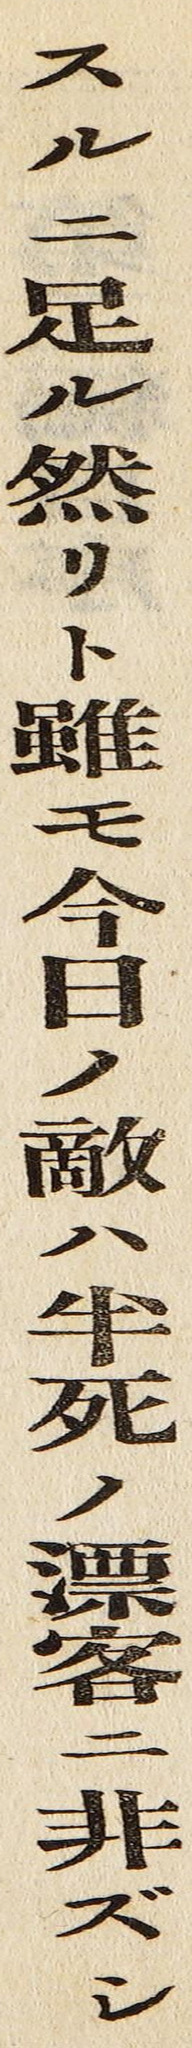スルニ足ル然リト雖モ今日ノ敵ハ半死ノ漂客ニ非ズシ
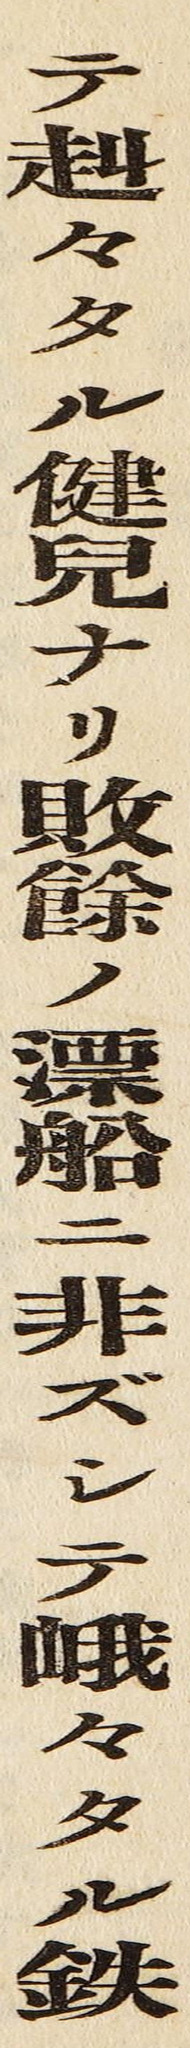テ赳々タル健児ナリ敗余ノ漂船ニ非ズシテ峨々タル鉄
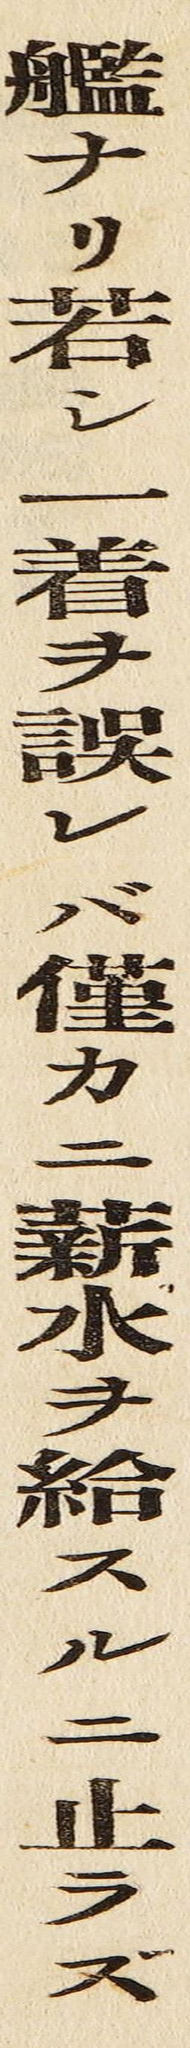艦ナリ若シ一着ヲ誤レバ僅カニ薪水ヲ給スルニ止ラズ
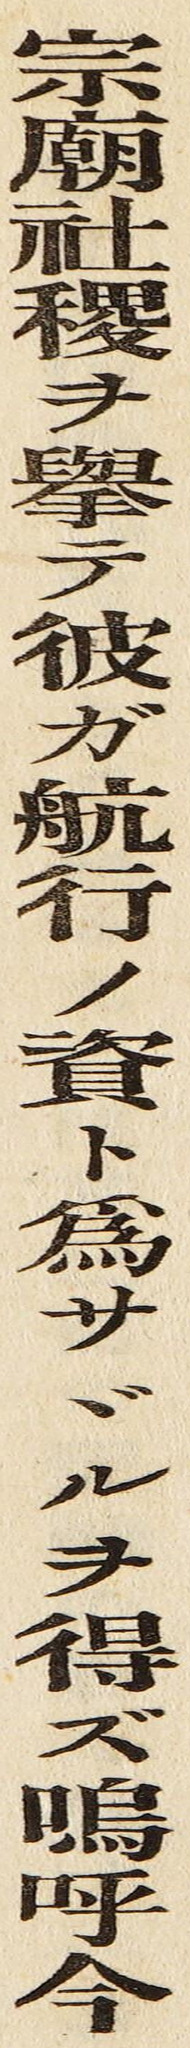宗廟社稷ヲ挙テ彼ガ航行ノ資ト為サヾルヲ得ズ嗚呼今
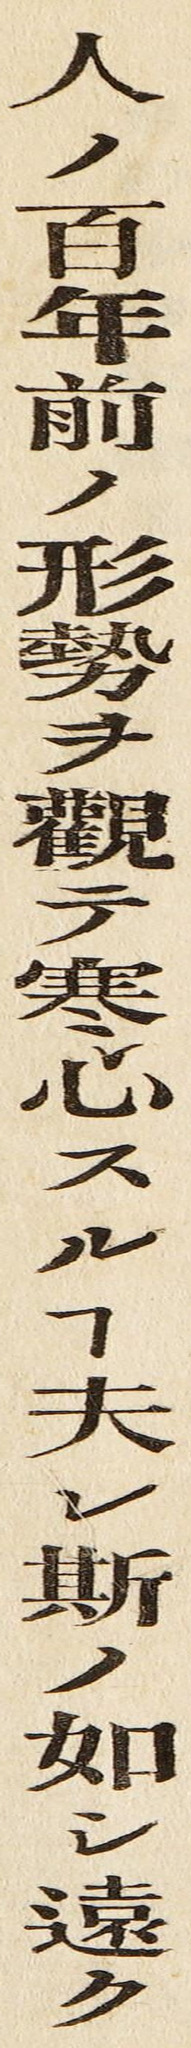人ノ百年前ノ形勢ヲ観テ寒心スルコト夫レ斯ノ如シ遠ク
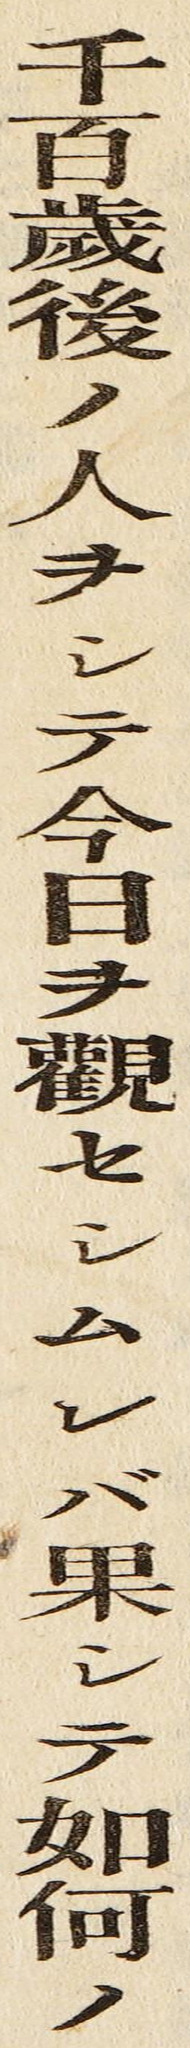千百歳後ノ人ヲシテ今日ヲ観セシムレバ果シテ如何ノ
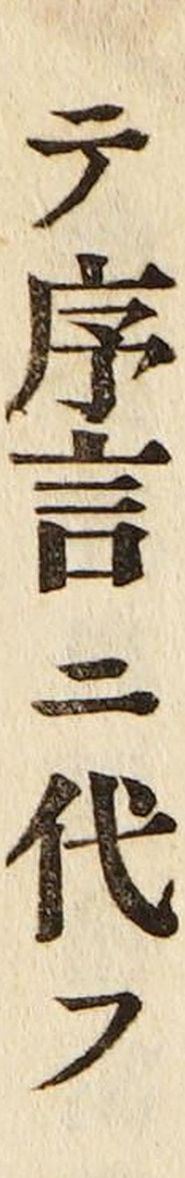テ序言ニ代フ
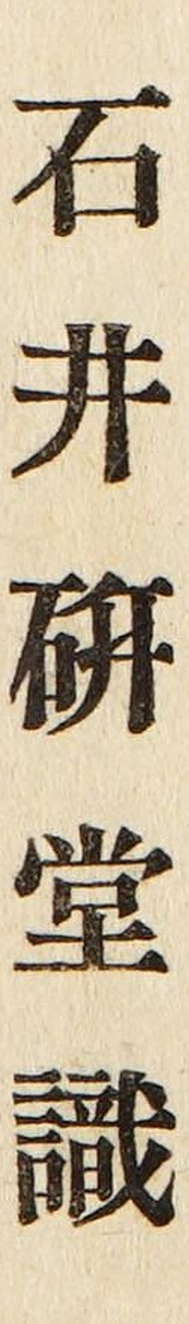石井研堂識

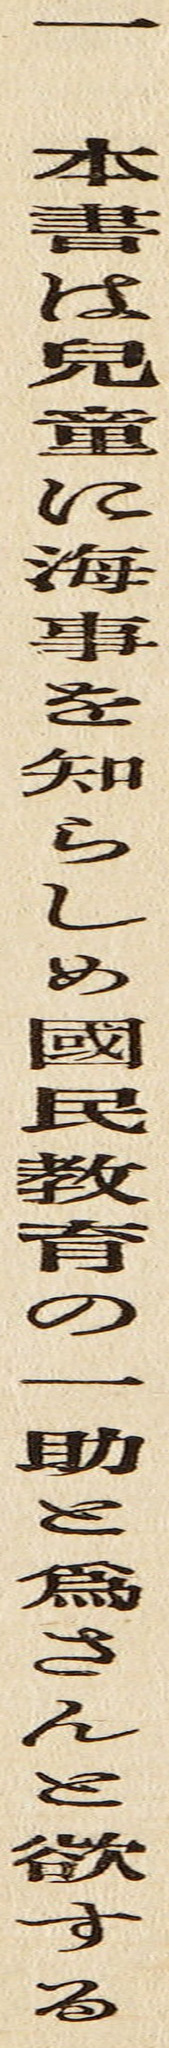一本書は児童に海事を知らしめ国民教育の一助と為さんと欲する
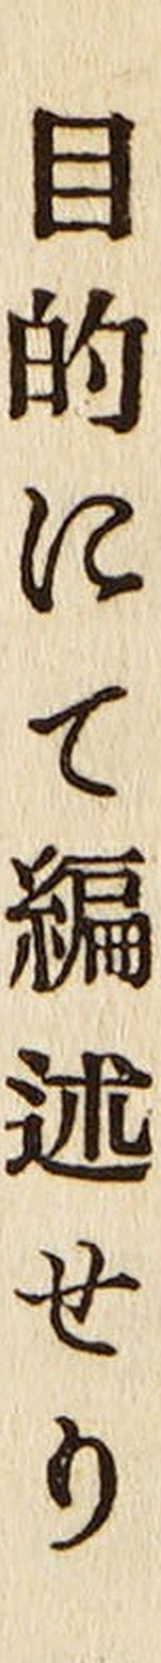目的にて編述せり
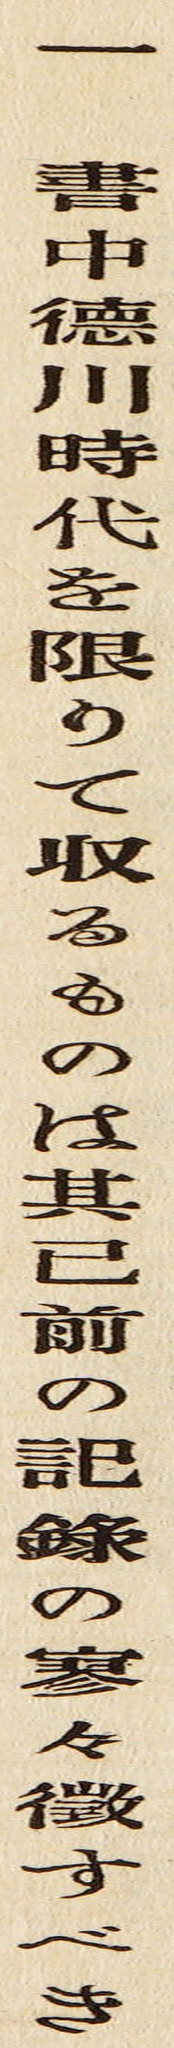一書中徳川時代を限りて収るものは其已前の記録の寥々徴すべき
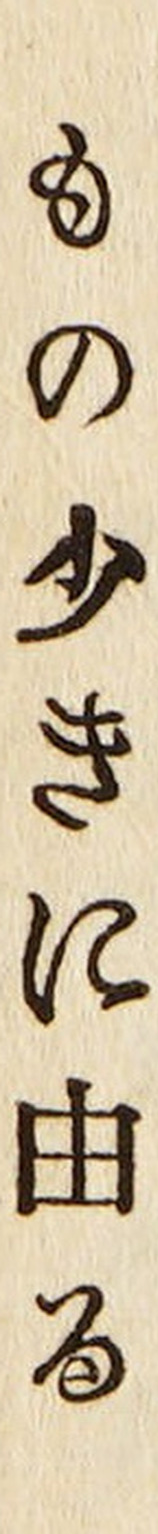もの少きに由る
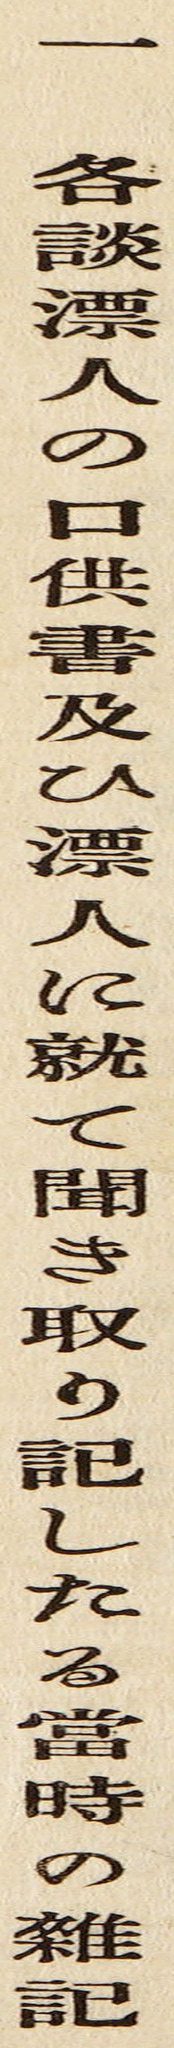一各談漂人の口供書及ひ漂人に就て聞き取り記したる当時の雑記
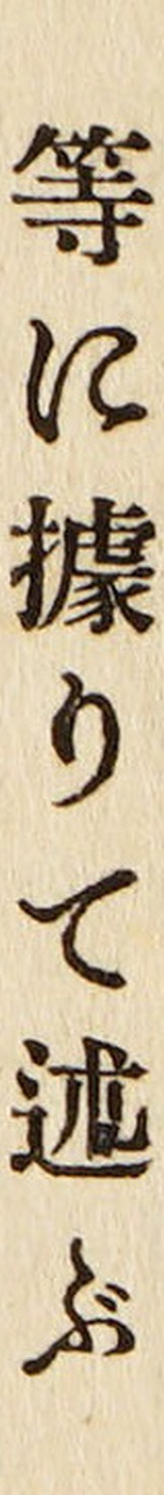等に拠りて述ぶ
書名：日本漂流譚
